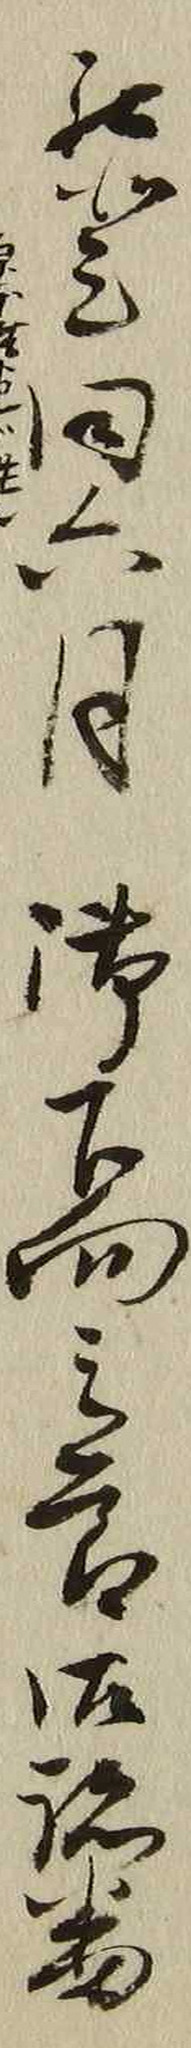罷登同六月御下向之節御諸番
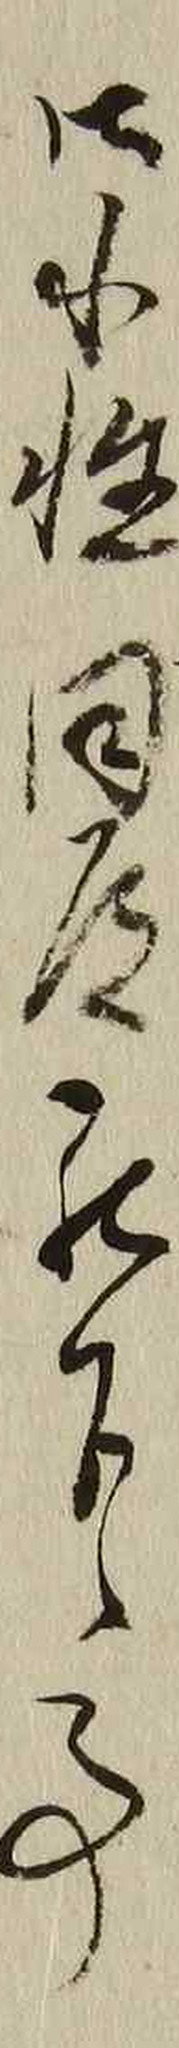御小性同道罷下候事
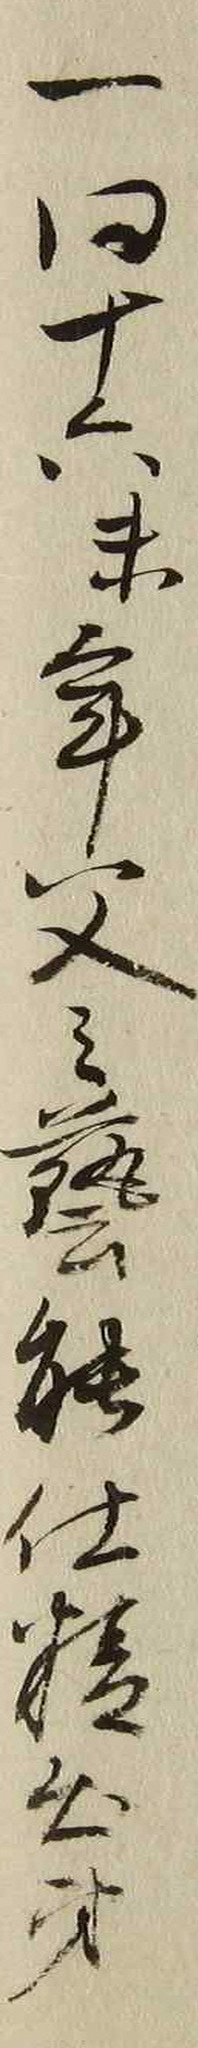一同十六未年父之芸能仕精出弟
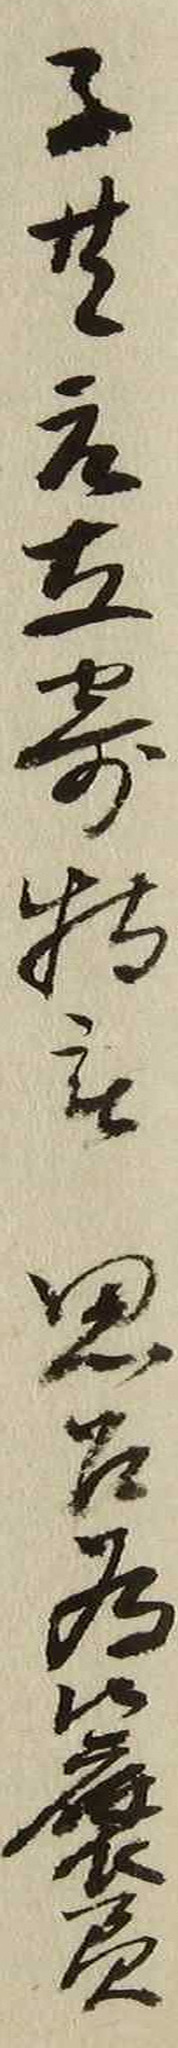子共取立奇特被思召為御褒美
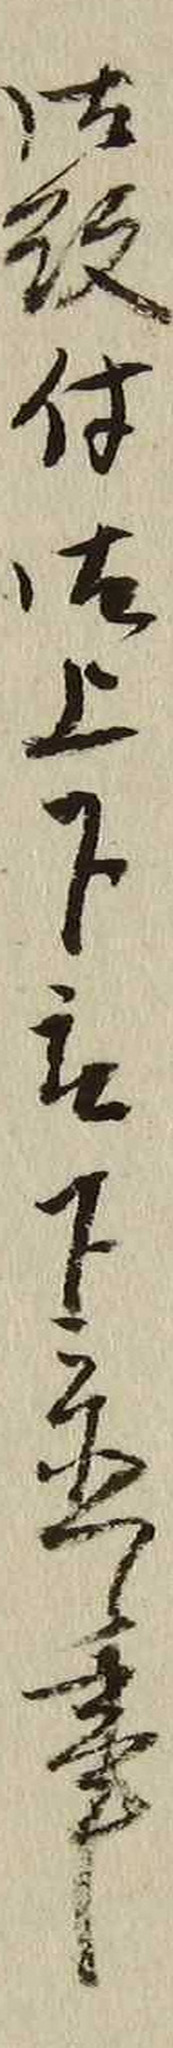御紋付御上下被下置候事
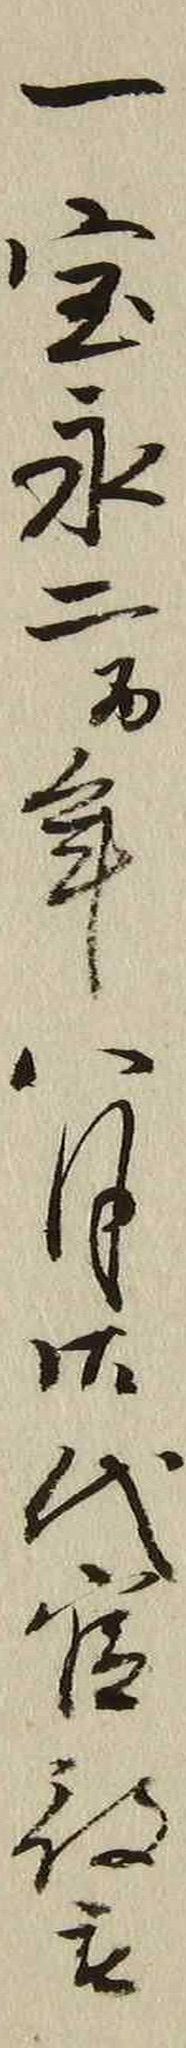一宝永二酉年八月御代官役被
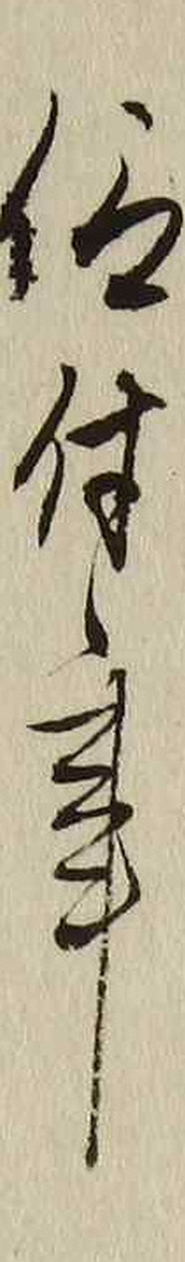仰付候事
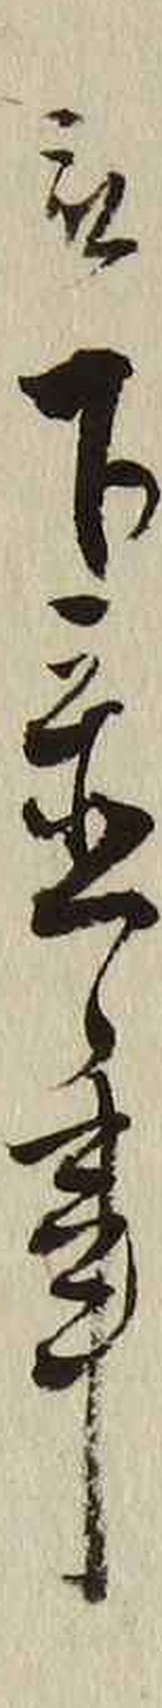被下置候事
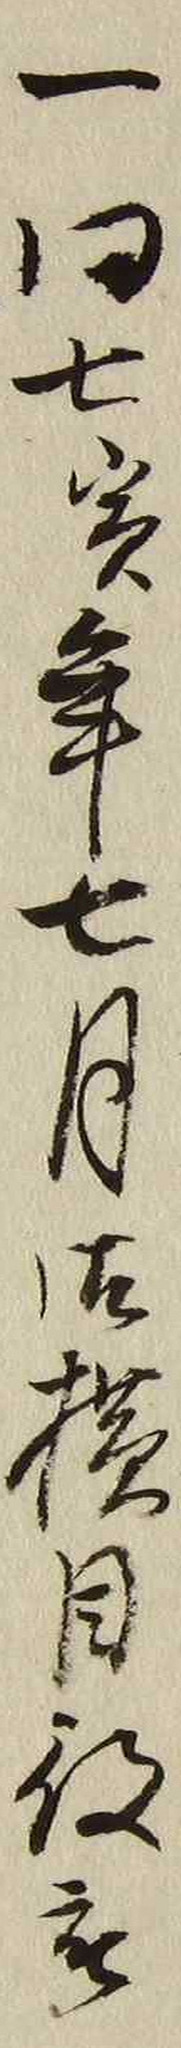一同七寅年七月御横目役被
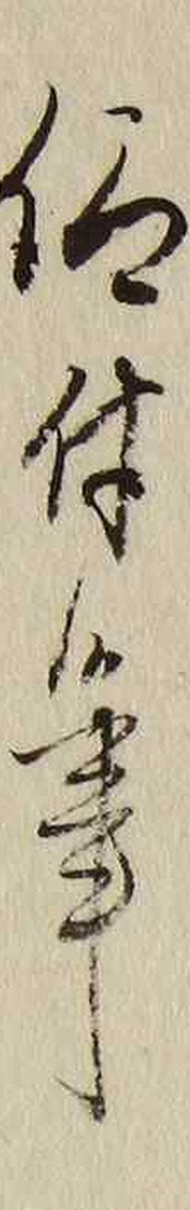仰付候事
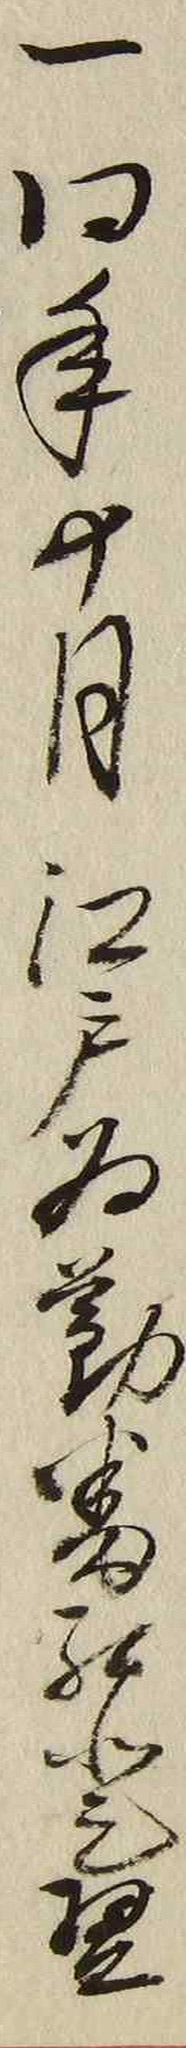一同年十月江戸為勤番罷登翌
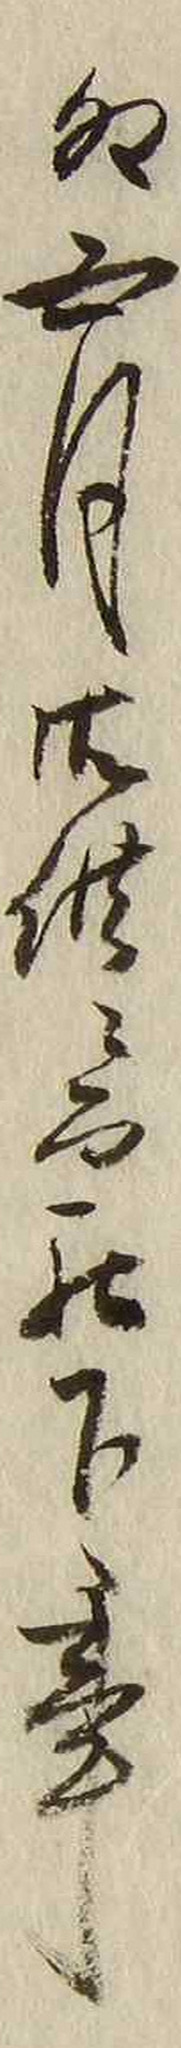卯五月御供ニ而罷下候事

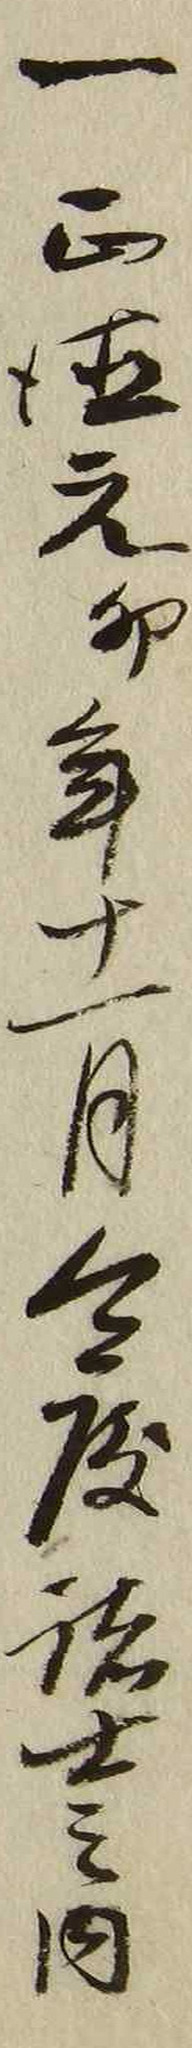一正徳元卯年十一月今度諸士之内
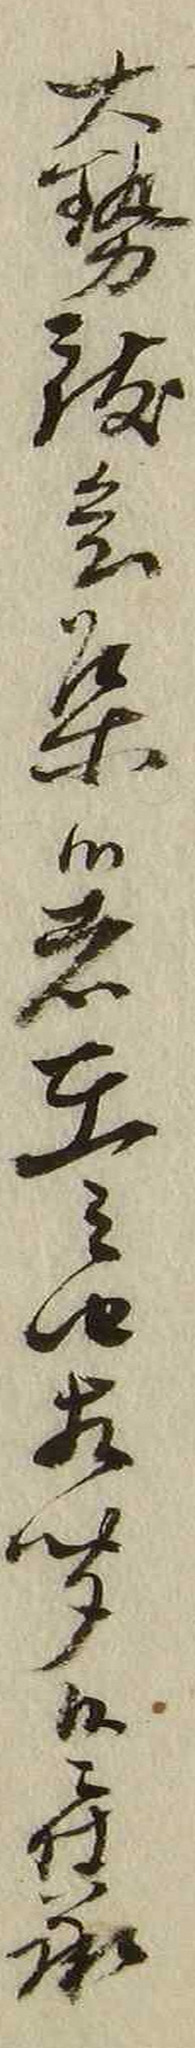大勢致参集候者在之由相聞候ニ付承
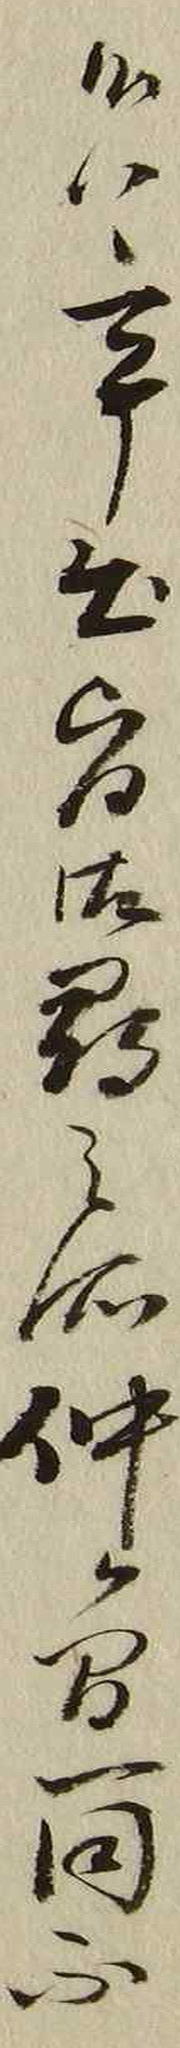候ハヽ可申出旨御尋之処仲ヶ間一同不
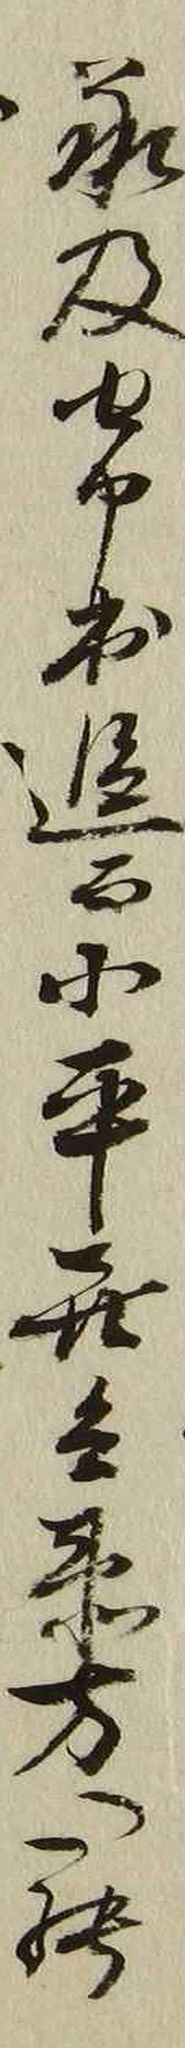承及由申出追而小平喜兵衛方へ罷
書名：諸士系譜　巻之352　す之部2
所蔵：会津若松市立会津図書館
